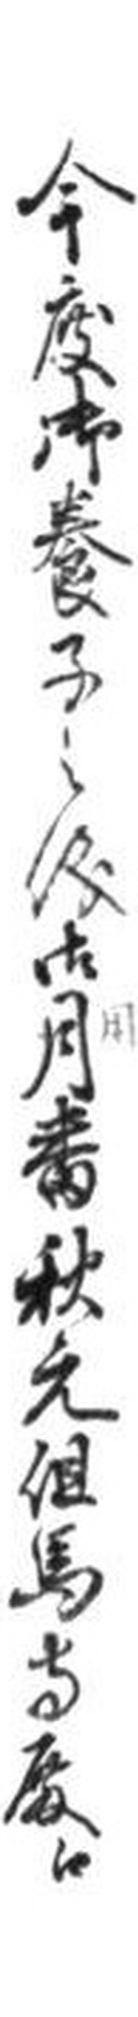今度御養子之儀御月番秋元但馬守殿江
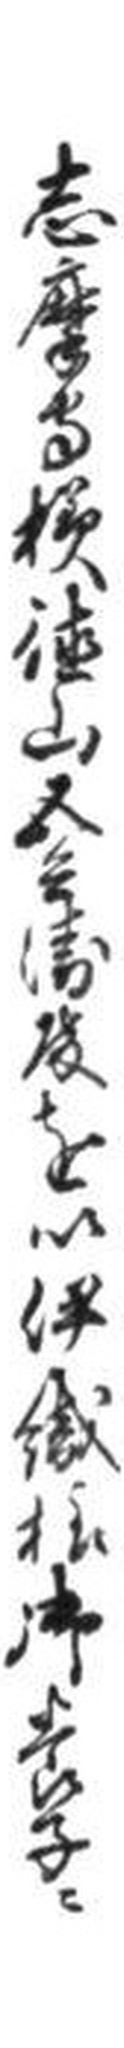志摩守様徳山五兵衛殿を以伊織様御養子ニ
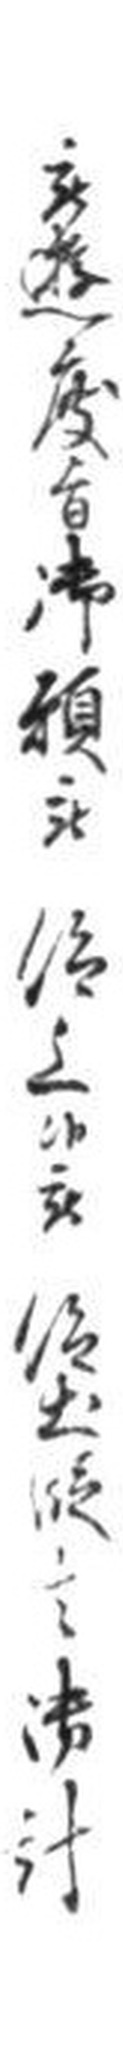被遊度旨御願被仰上候被仰出段其御計
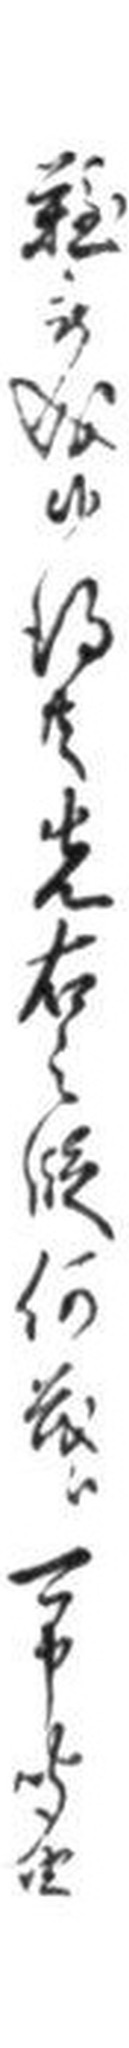難被成候得共先右之段何茂江可申聞由
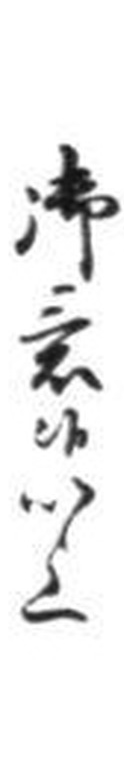御意候以上
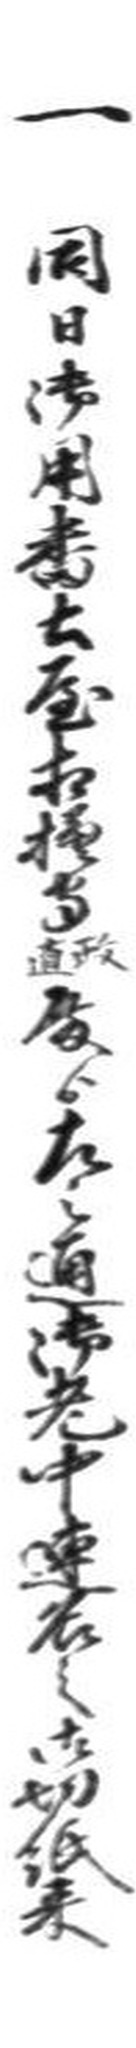一同日御用番土屋相模守政直殿ゟ左之通御老中連名之御切紙来
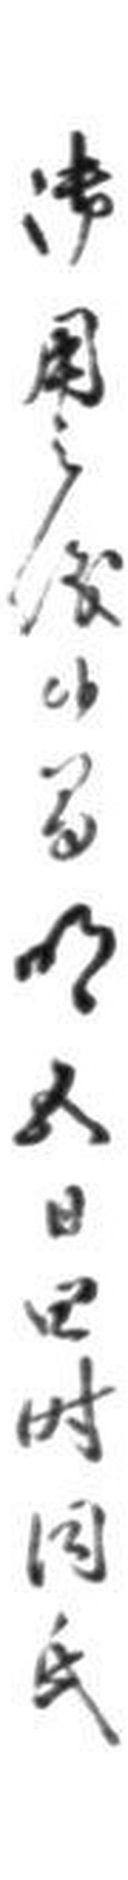御用之儀候間明五日四時同氏
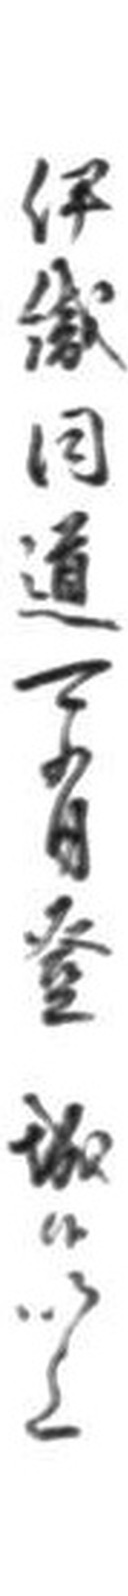伊織同道可有登城候以上
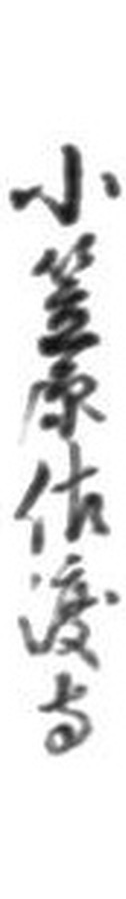小笠原佐渡守
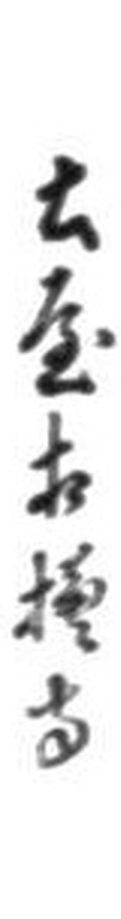土屋相模守
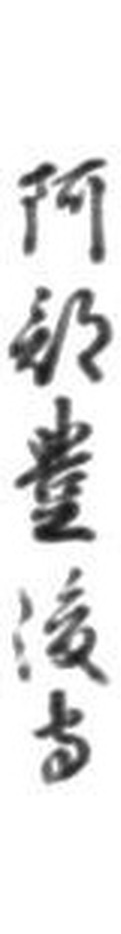阿部豊後守
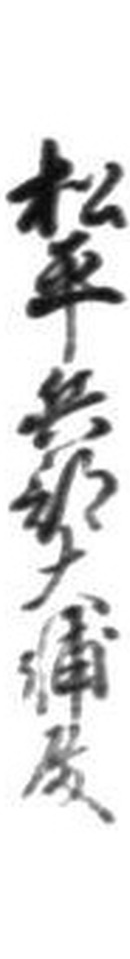松平兵部大輔殿

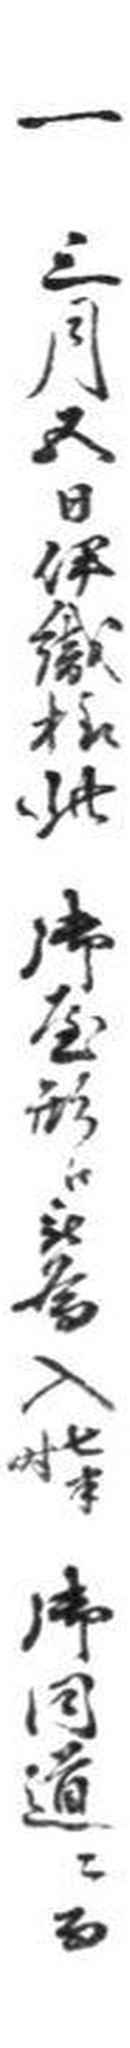一三月五日伊織様此御屋形江被為入七半時御同道ニ而
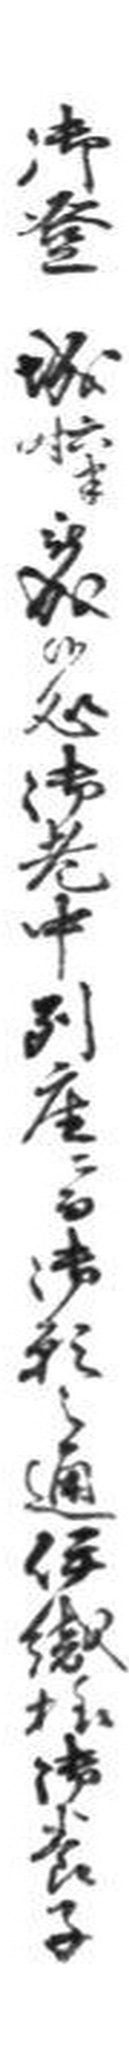御登城六半時被成候処御老中列座ニ而御願之通伊織様御養子
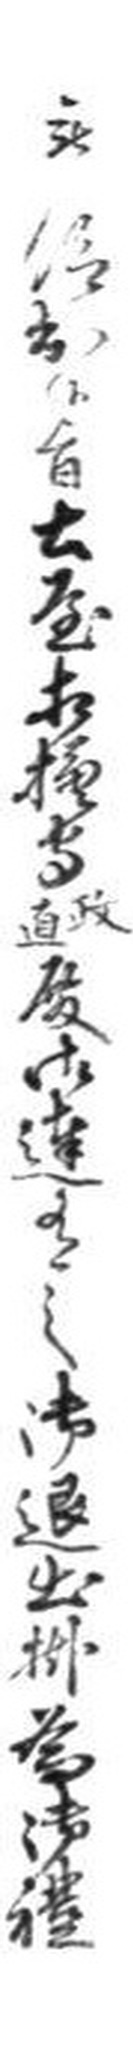被仰出候旨土屋相模守政直殿御達有之御退出掛為御礼
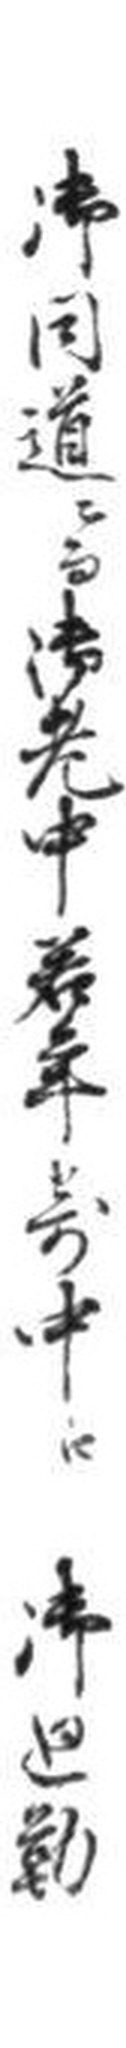御同道ニ而御老中若年寄中江御廻勤
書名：家譜 二十一 吉品公 従元禄十三年到同十四年
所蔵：福井県文書館 Fukui Prefectural Archives
